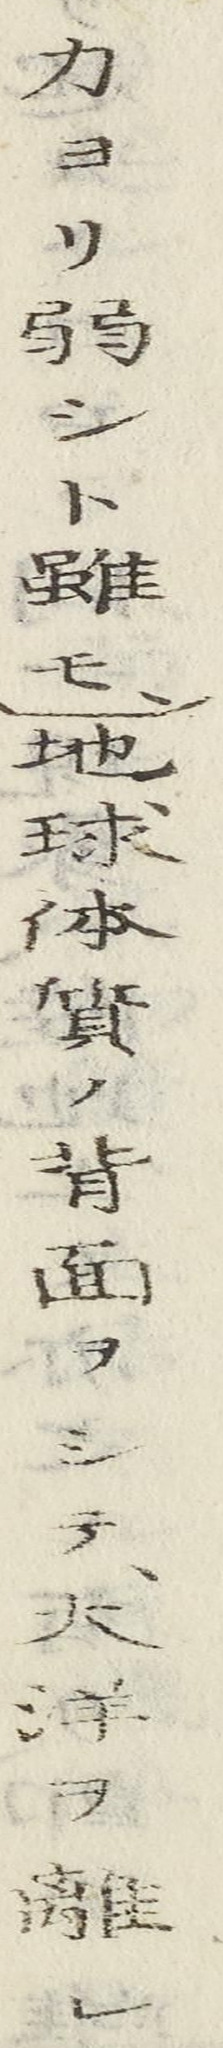チ力ヨリ弱シト雖モ、）地球体質ノ背面ヲシテ、大洋ヲ離レ
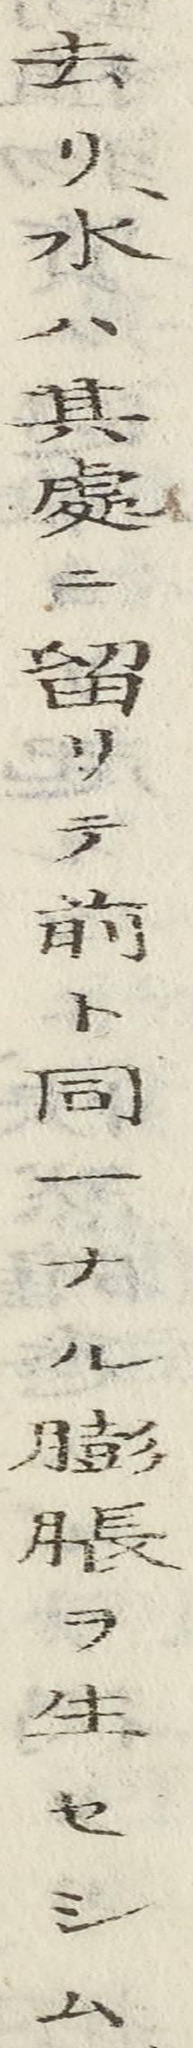第去リ、水ハ其処ニ留リテ前ト同一ナル膨脹ヲ生セシム
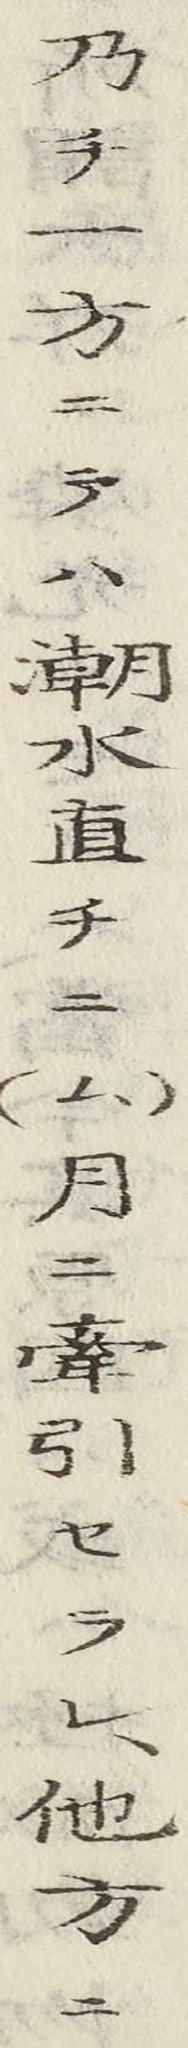四イ乃チ一方ニテハ潮水直チニ月ニ牽引セラレ、他方ニ
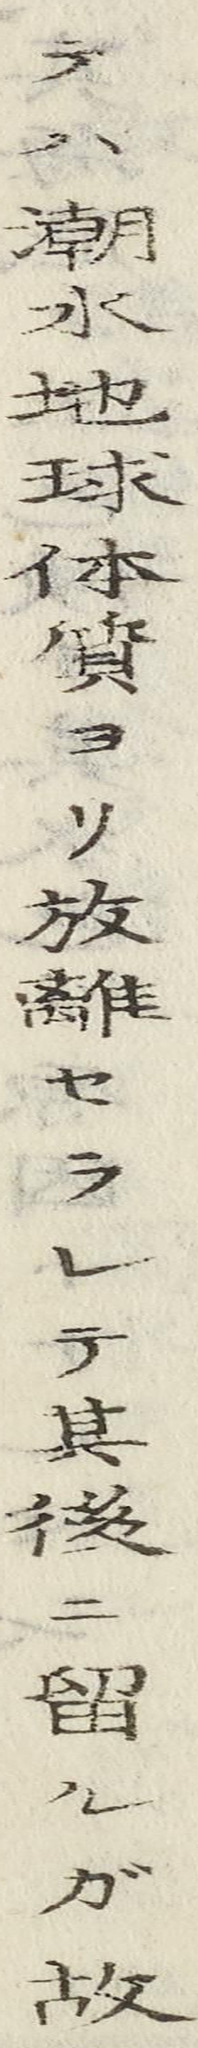図テハ潮水地球体質ヨリ放離セラレテ其後ニ留ルガ故
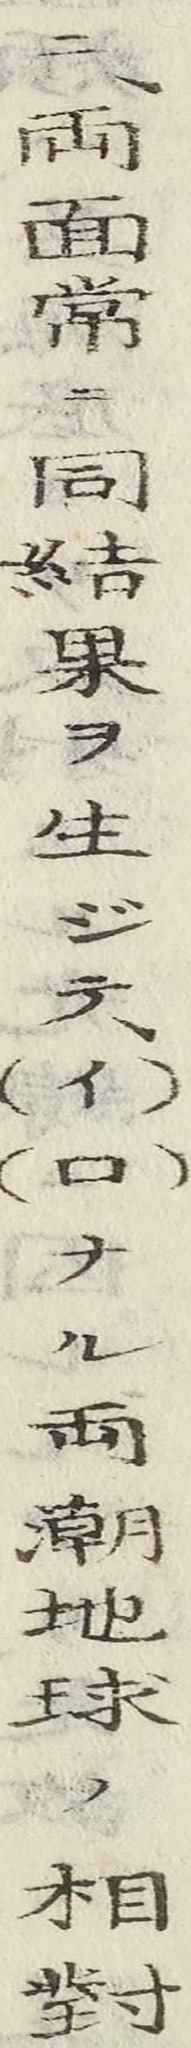ニ、両面常ニ同結果ヲ生ジテ、ナル両潮地球ノ相対
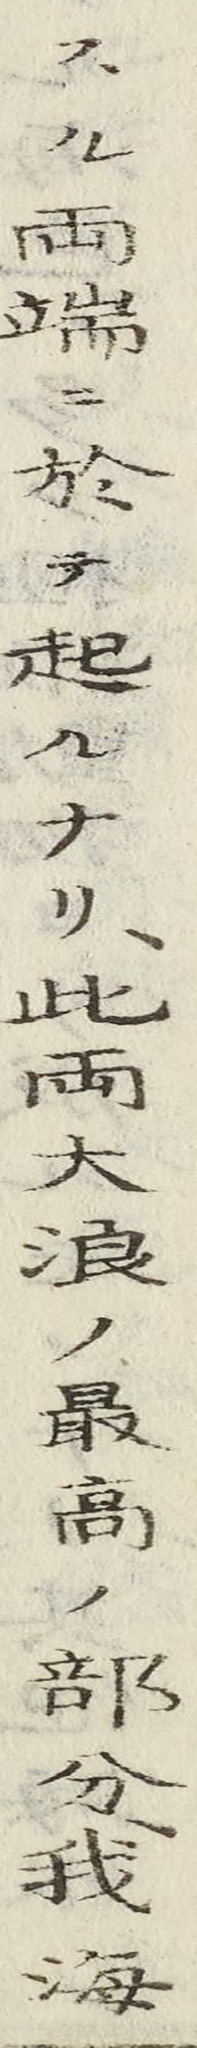ムスル両端ニ於テ起ルナリ、此両大浪ノ最高ノ部分、我海
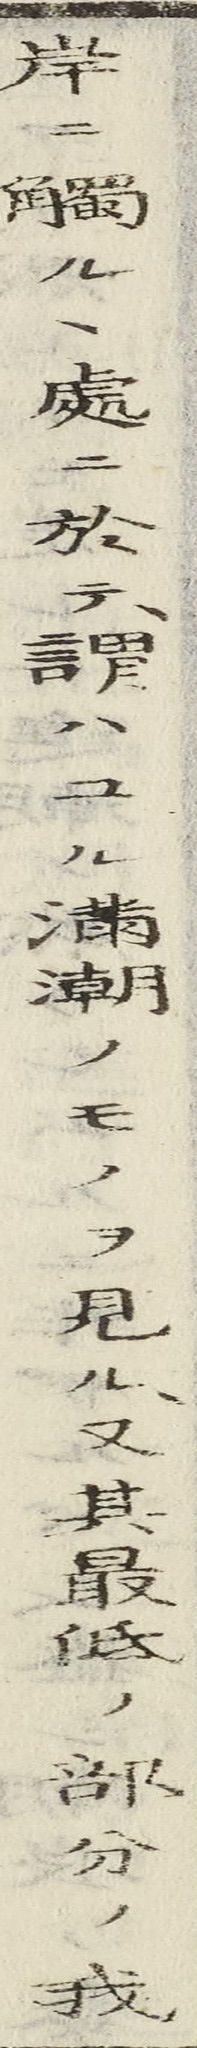岸ニ触ルヽ処ニ於テ、謂ハユル満潮ノモノヲ見ル、又其最低ノ部分ノ我
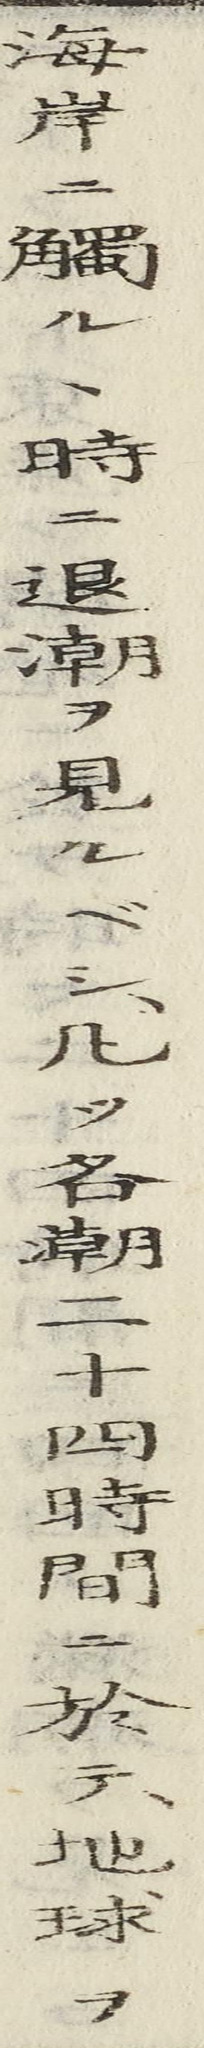海岸ニ触ルヽ時ニ退潮ヲ見ルベシ、凡ソ各潮二十四時間ニ於テ、地球ヲ
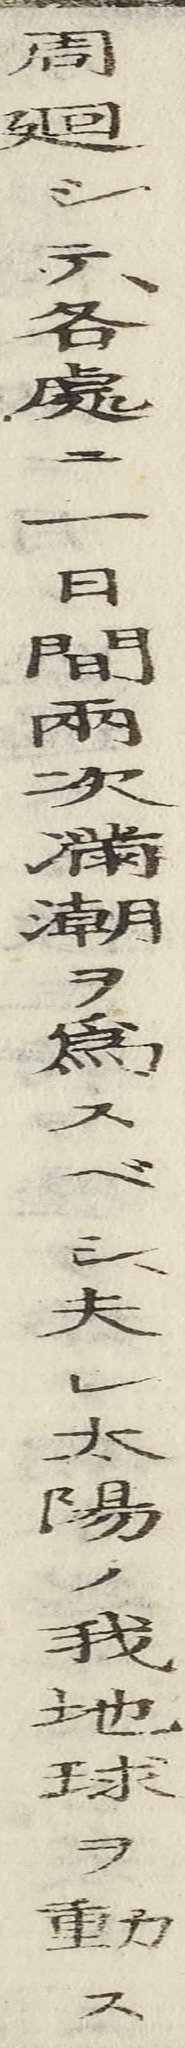周廻シテ、各処ニ一日間両次満潮ヲ為スベシ、夫レ太陽ノ我地球ヲ動ス
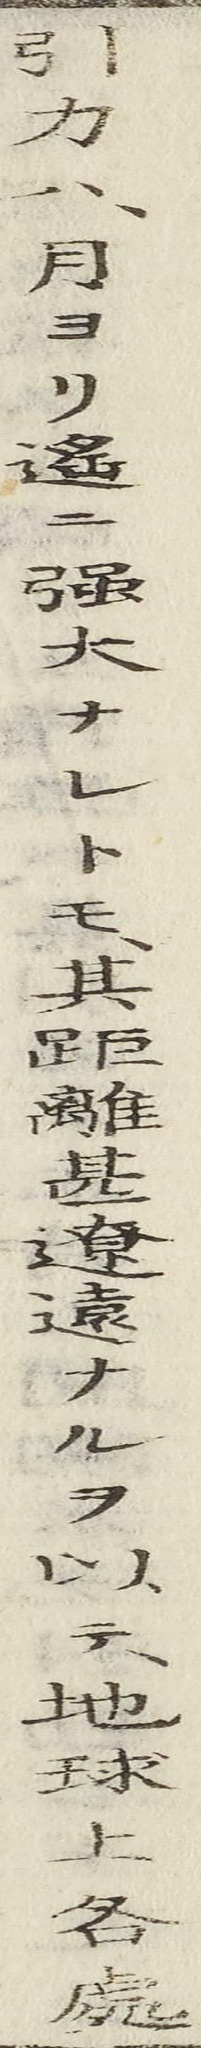引力ハ、月ヨリ遥ニ強大ナレトモ、其距離甚遼遠ナルヲ以テ、地球上各処
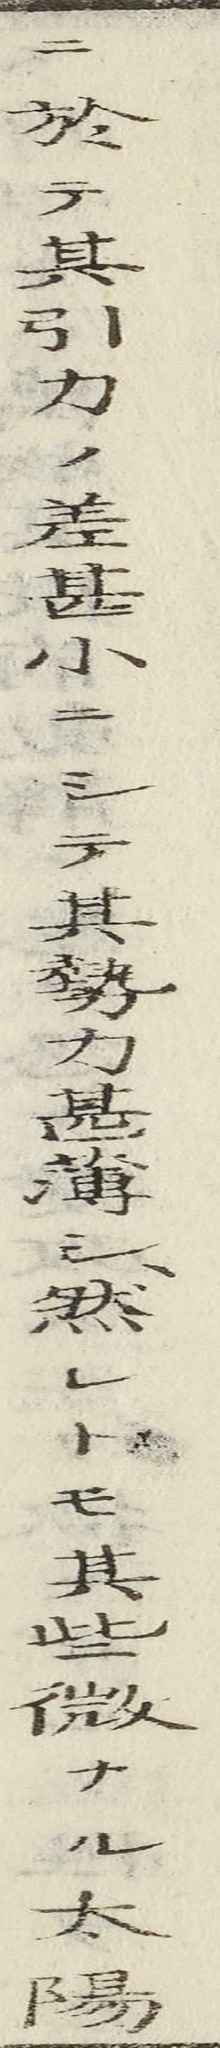ニ於テ其引力ノ差甚小ニシテ其勢力甚薄シ、然レトモ其些微ナル太陽
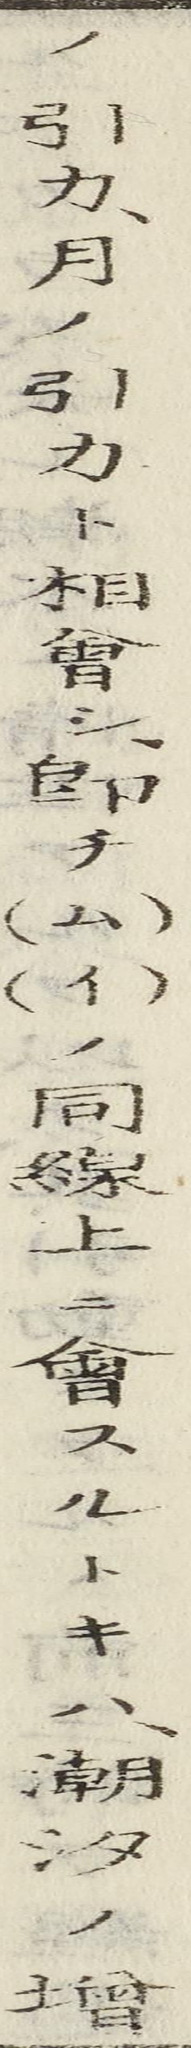ノ引力、月ノ引力ト相会シ、即チノ同線上ニ会スルトキハ、潮汐ノ増
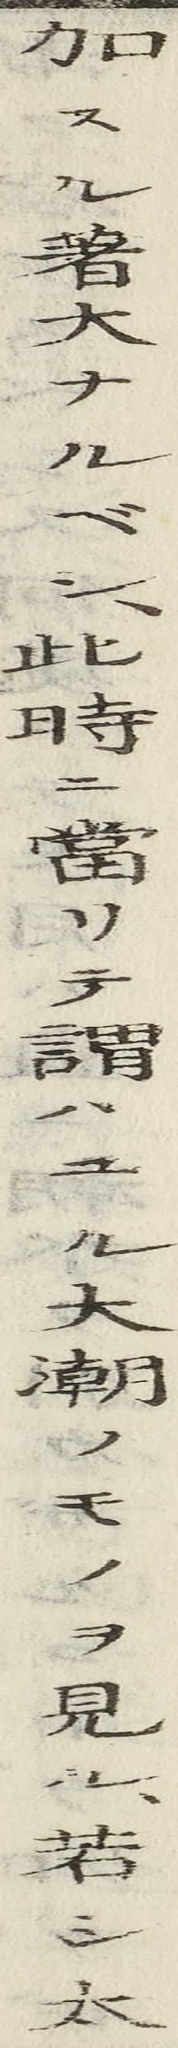加スル著大ナルベシ、此時ニ当リテ謂ハユル大潮ノモノヲ見ル、若シ太
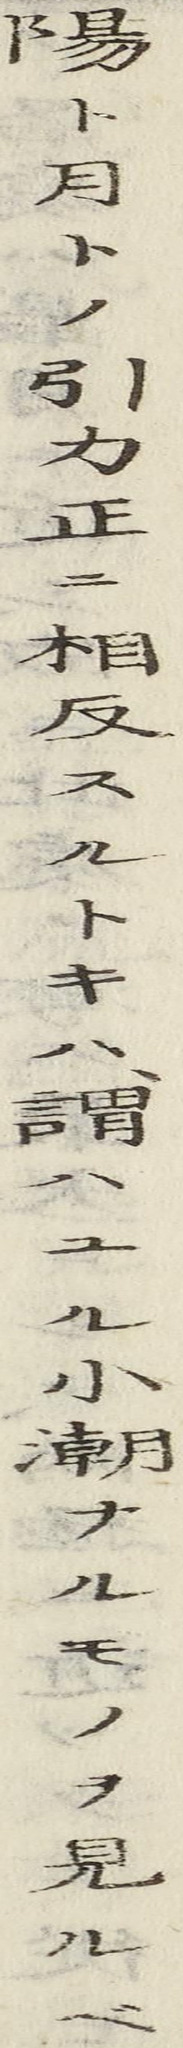陽ト月トノ引力正ニ相反スルトキハ、謂ハユル小潮ナルモノヲ見ルベ
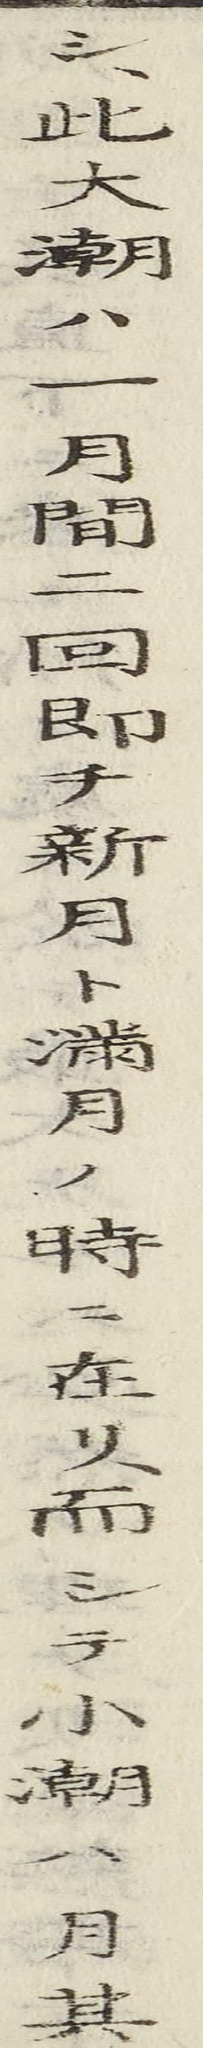シ、此大潮ハ一月間二回即チ新月ト満月ノ時ニ在リ、而シテ小潮ハ月其
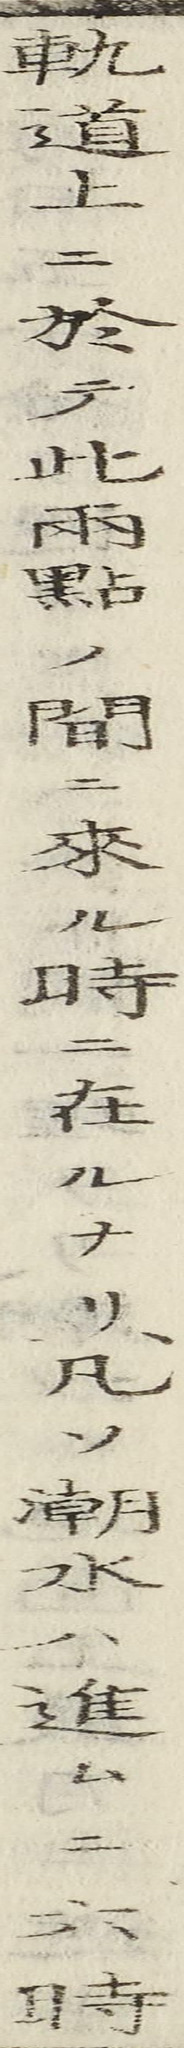軌道上ニ於テ此両点ノ間ニ来ル時ニ在ルナリ、凡ソ潮水ハ進ムニ六時
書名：百科全書　地文學　全
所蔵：東京大学地震研究所図書室 Earthquake Research Institute Library, The University of Tokyo, JAPAN
